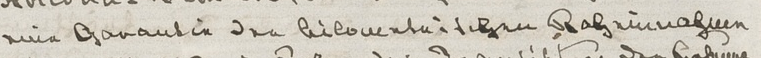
eine Garantie der kilometrischen Roheinnamnen
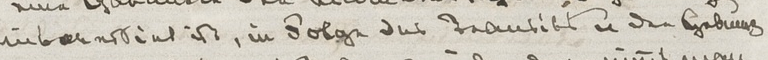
interessiert ist, in Folge des Transits u der Hebung
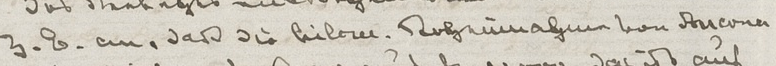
z. B. an, daß die kilom. Roheinnahmen von Ancona
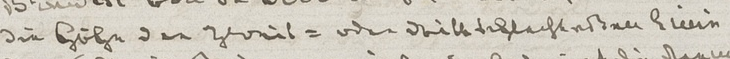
die Höhe der zweit- oder drittschlechtesten Linie
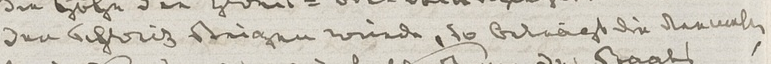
der Schweiz steigen würde, so beträgt die Vermehrung
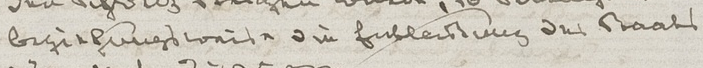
beziehungsweise die Entlastung des Staats
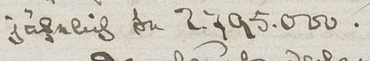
jährlich Fr 2.795.000.
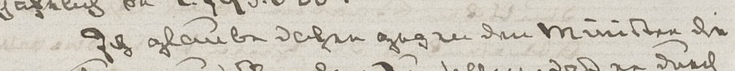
Ich glaube daher gegen den Minister die
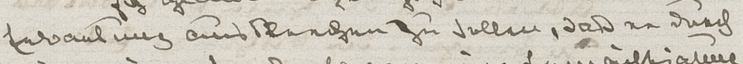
Erwartung aussprechen zu sollen, daß er durch
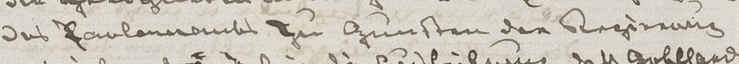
des Parlaments zu Gunsten der Regierung
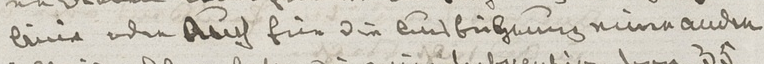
linie oder auch für die Ausführung einer andern
